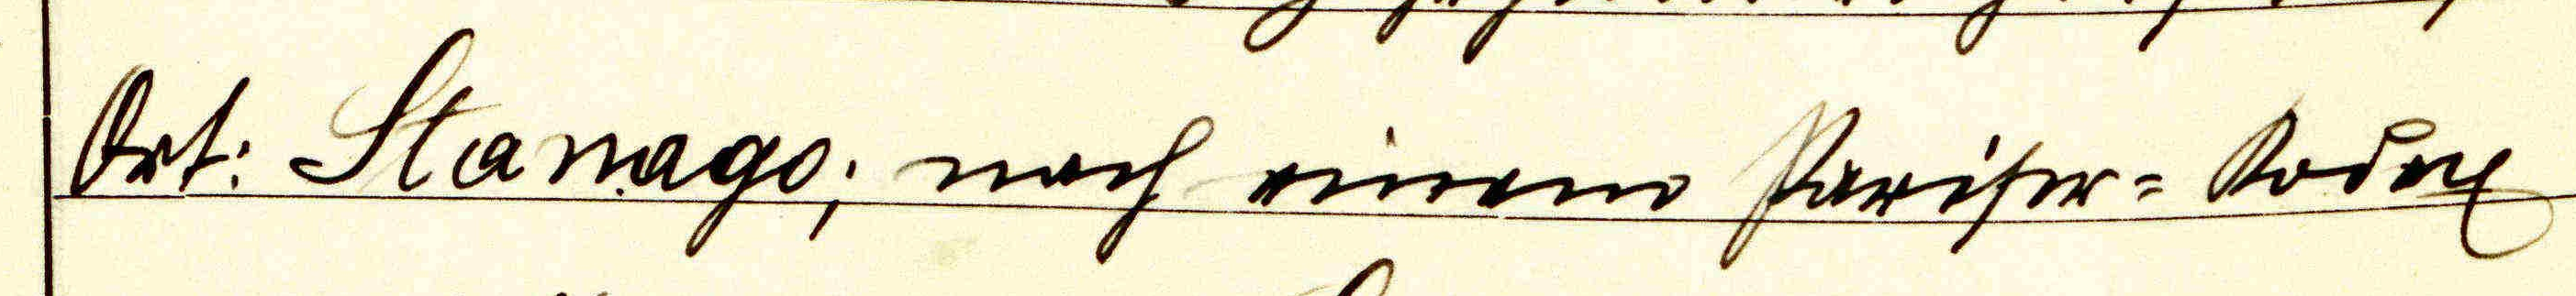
Ort: Stanago; nach einem Pariser-Kodex
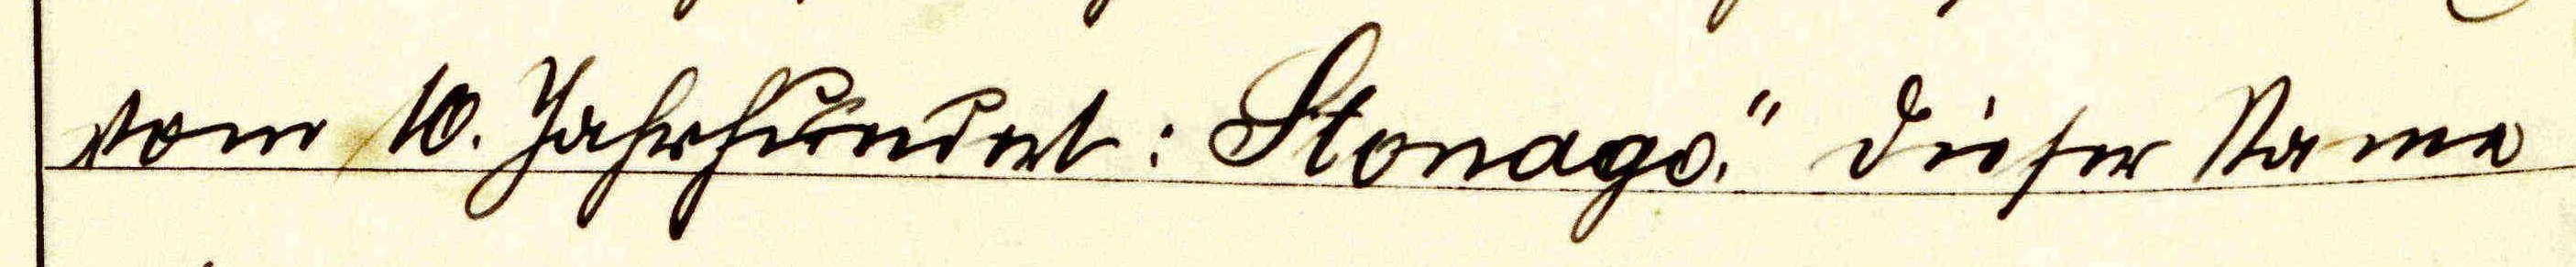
vom 10.Jahrhundert: Stonago“ Dieser Name
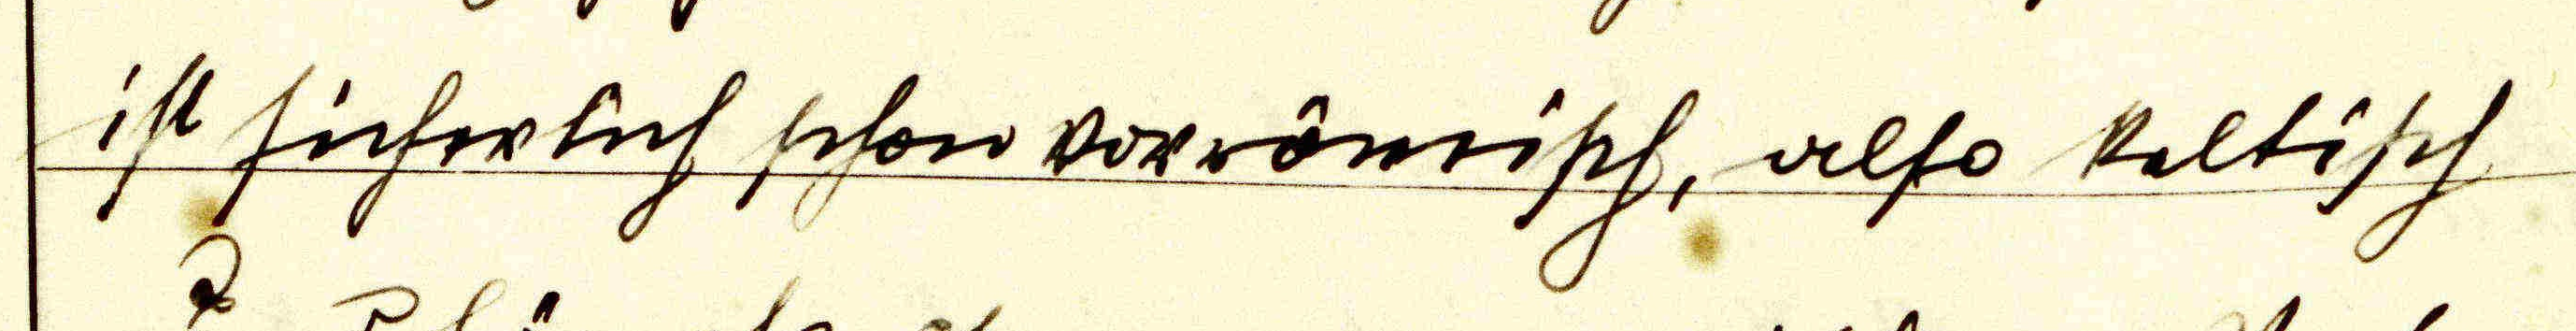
ist sicherlich schon vorrömisch, also keltisch
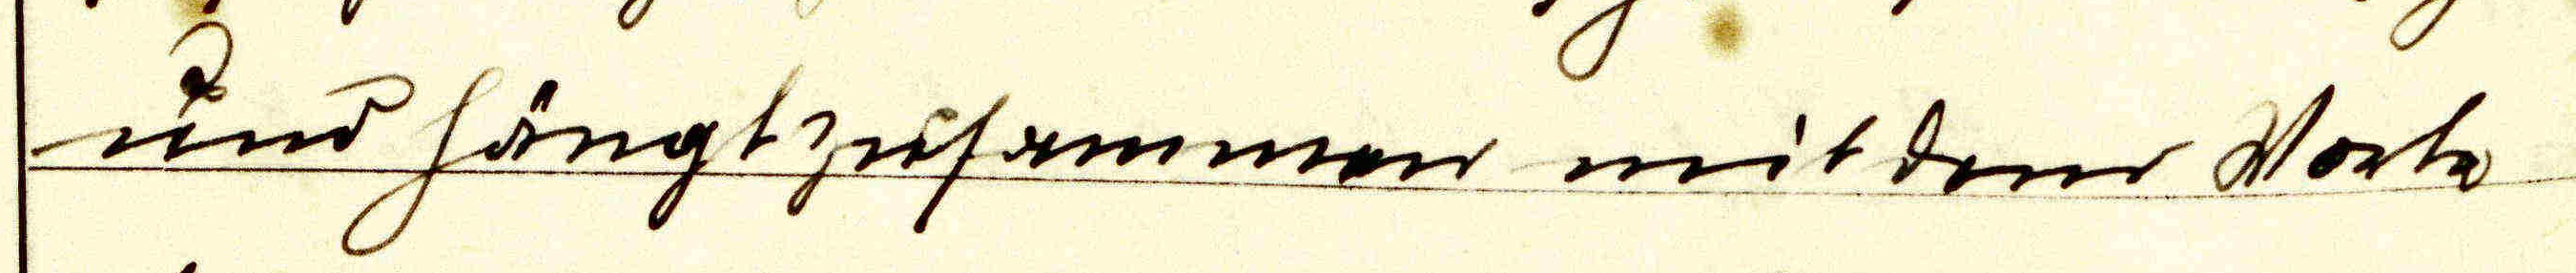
und hängt zusammen mit dem Worte
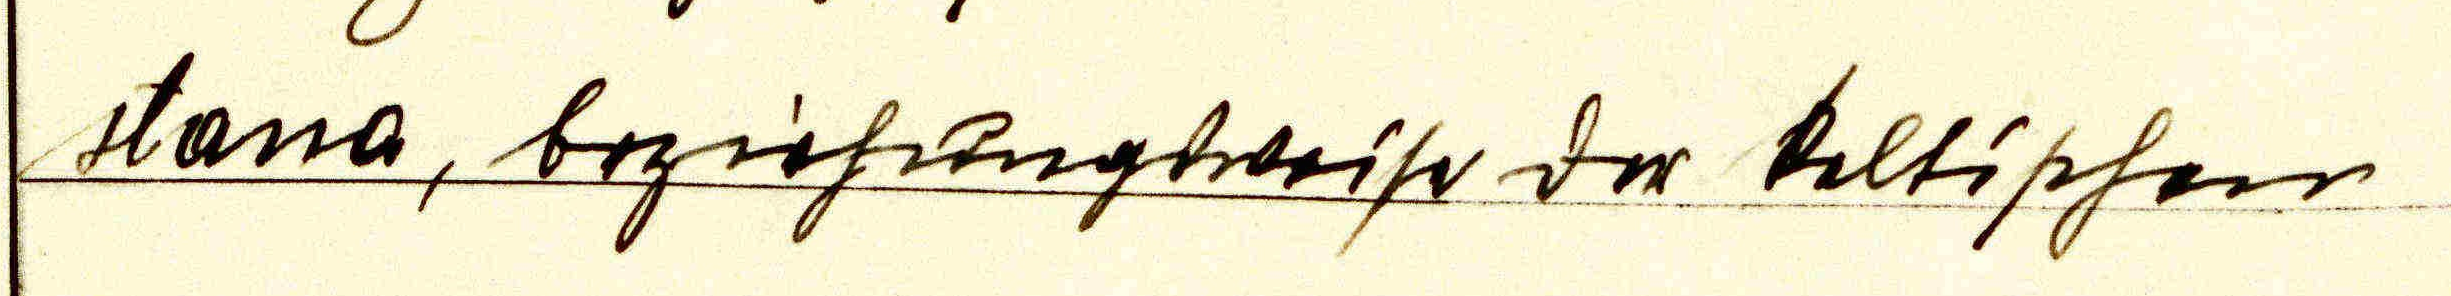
stana, beziehungsweise der keltischen
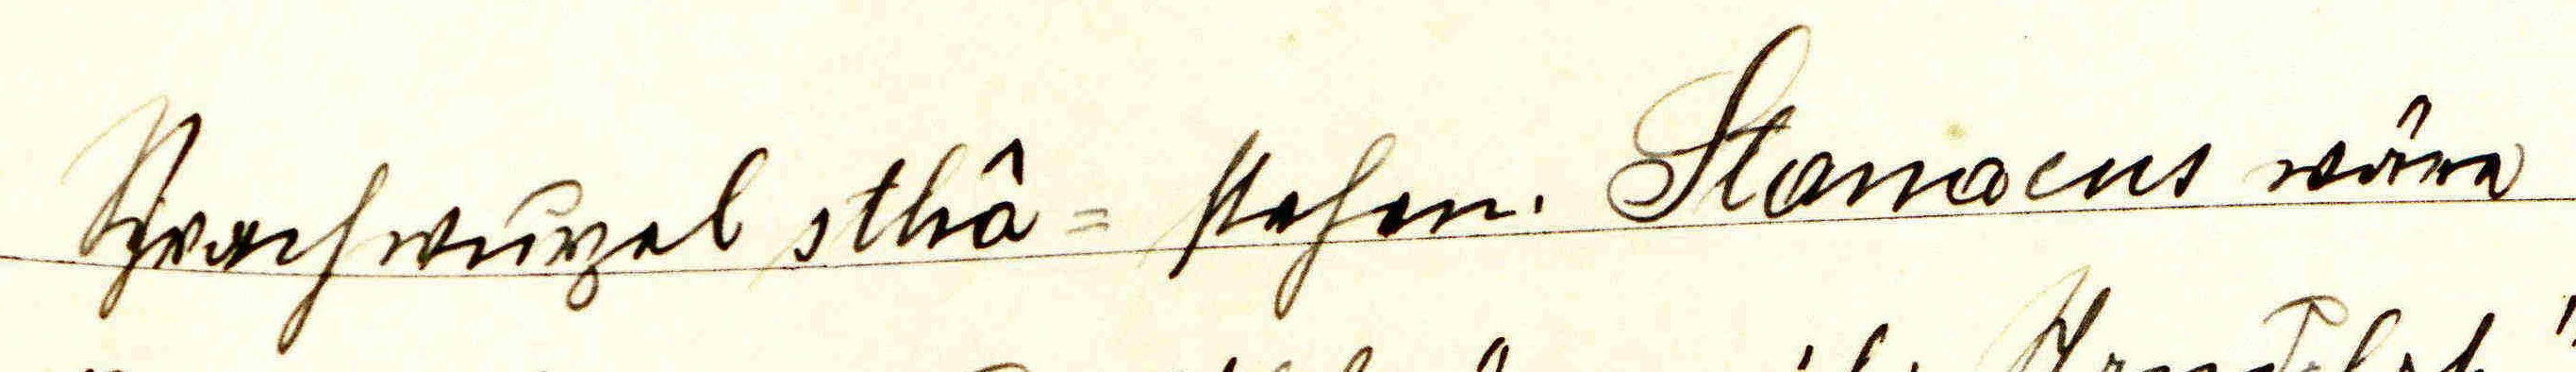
Strachwurzel stha = stehen. Stanacus wäre
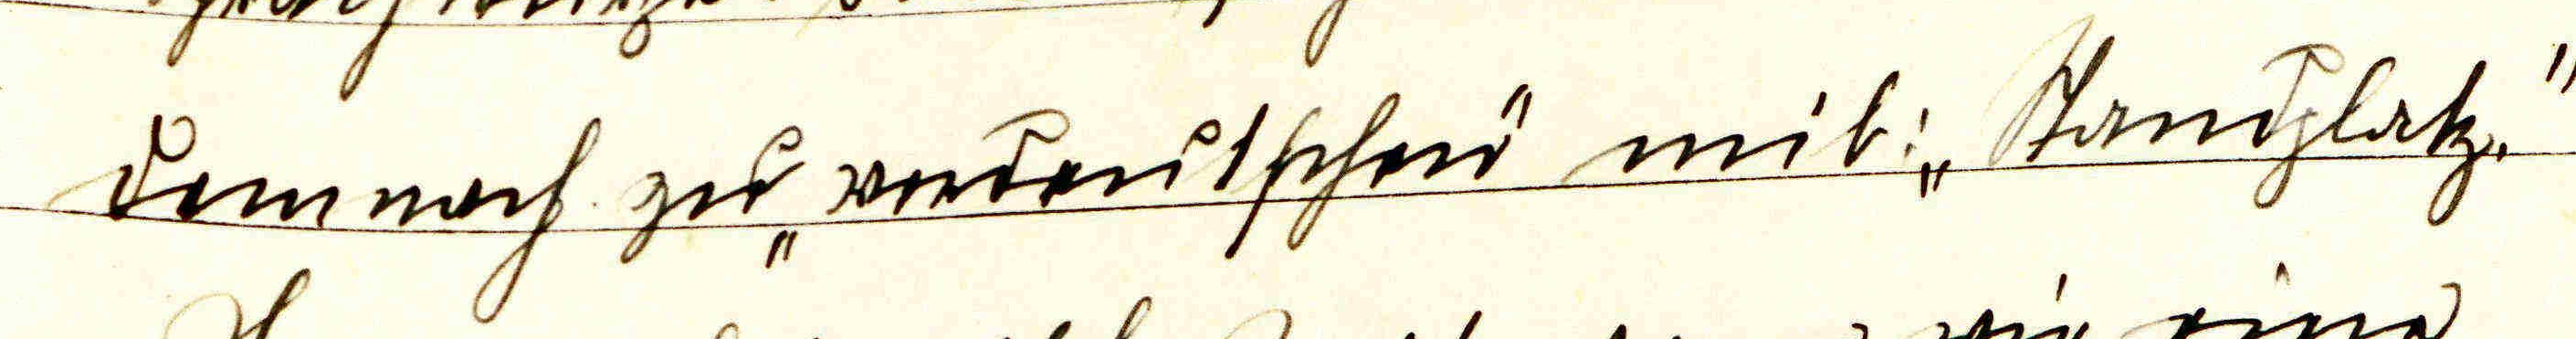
demnach zu „verdeutschen“ mit „Standplatz“.
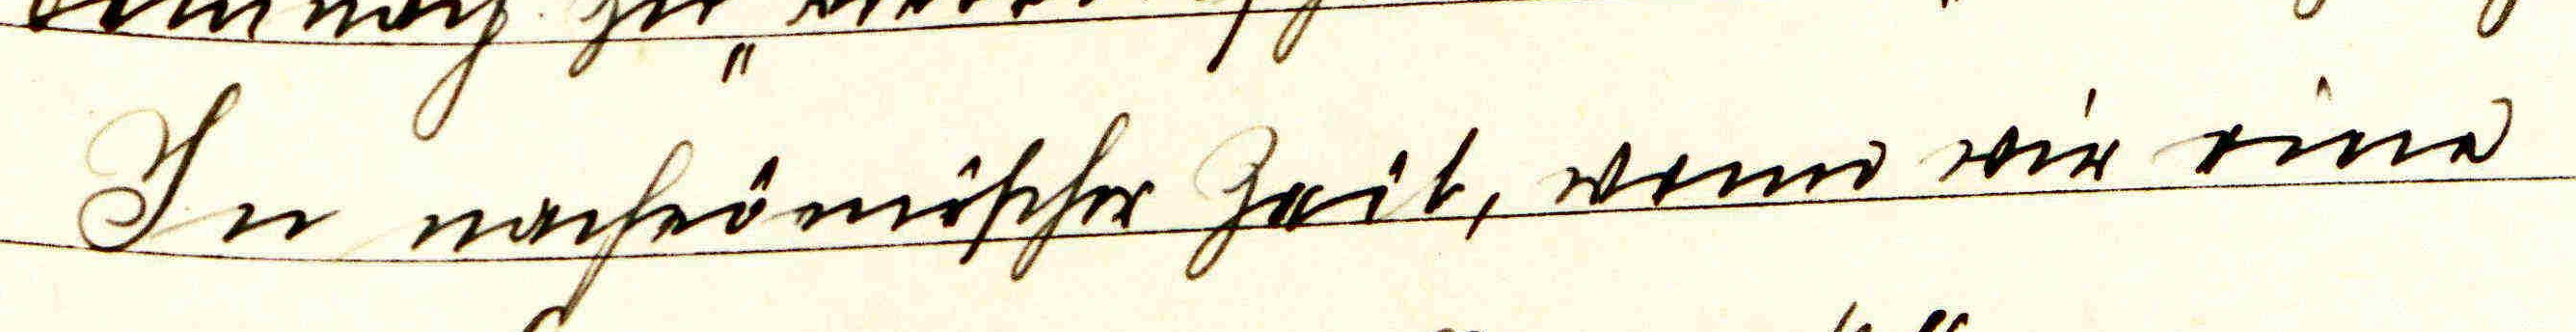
In nachrömischer Zeit, wenn wir eine
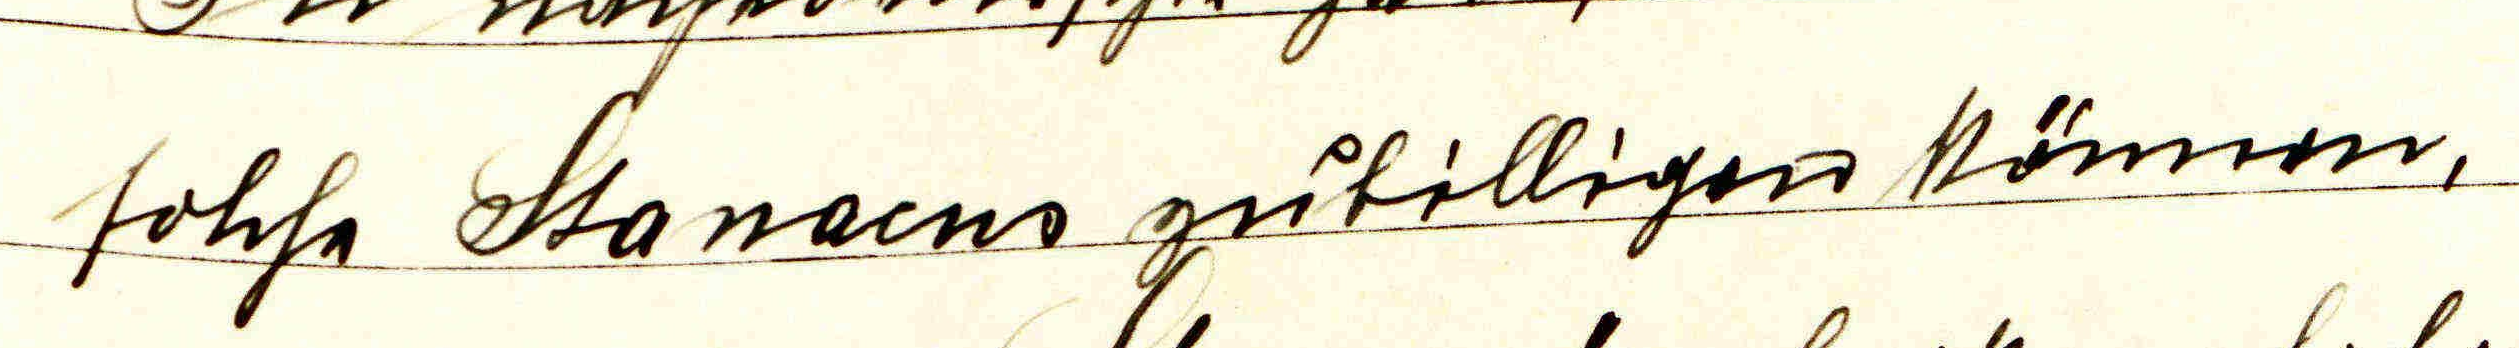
solche Stanacus zubilligen können,
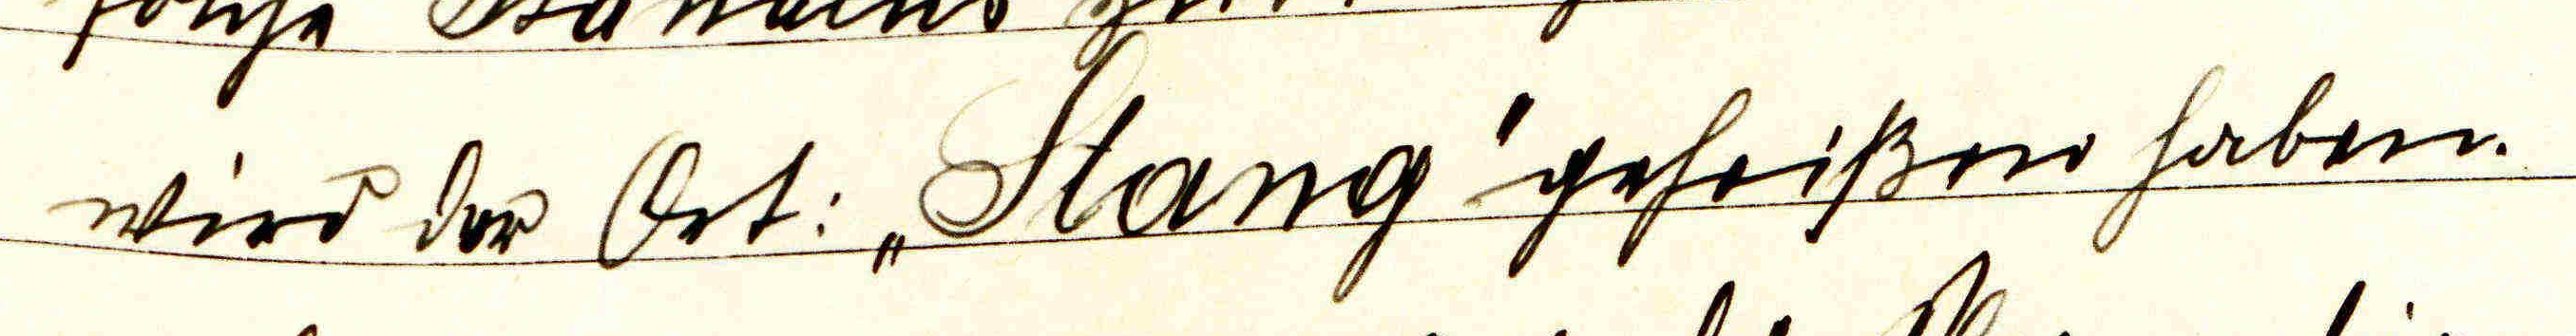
wird der Ort: „Stang“ geheißen haben.
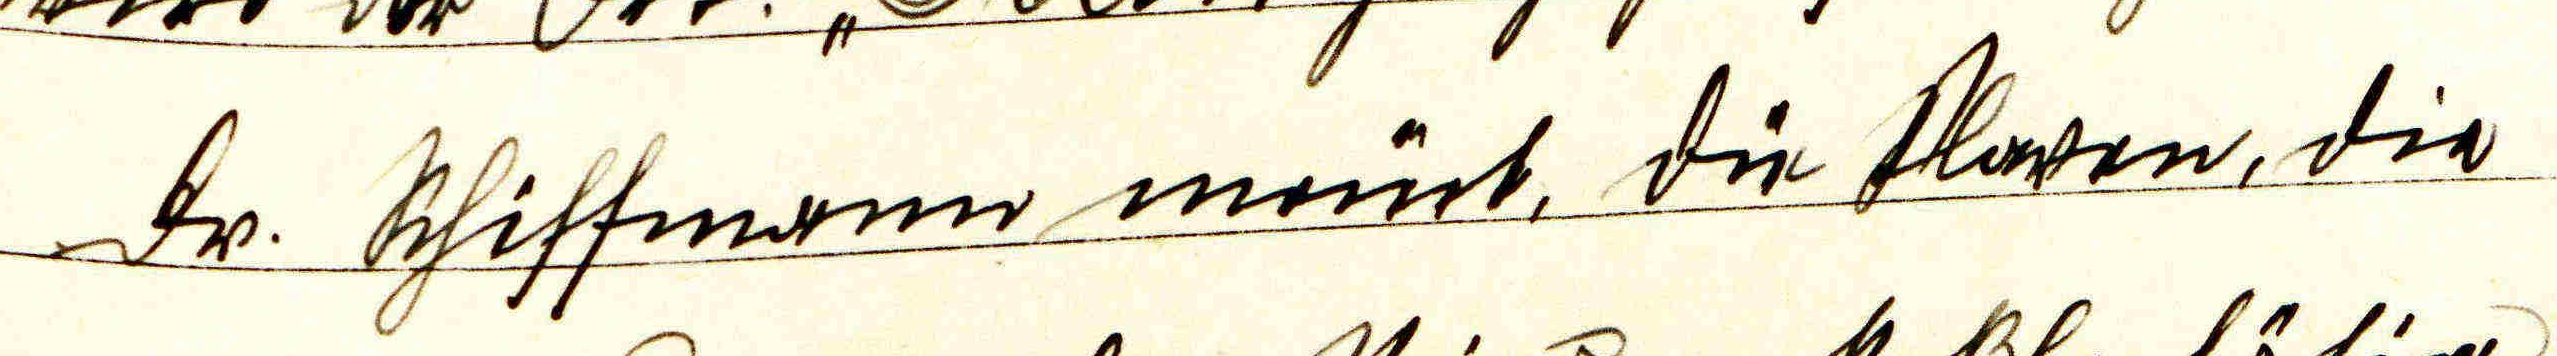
Dr. Schiffmann meint, die Slaven, die
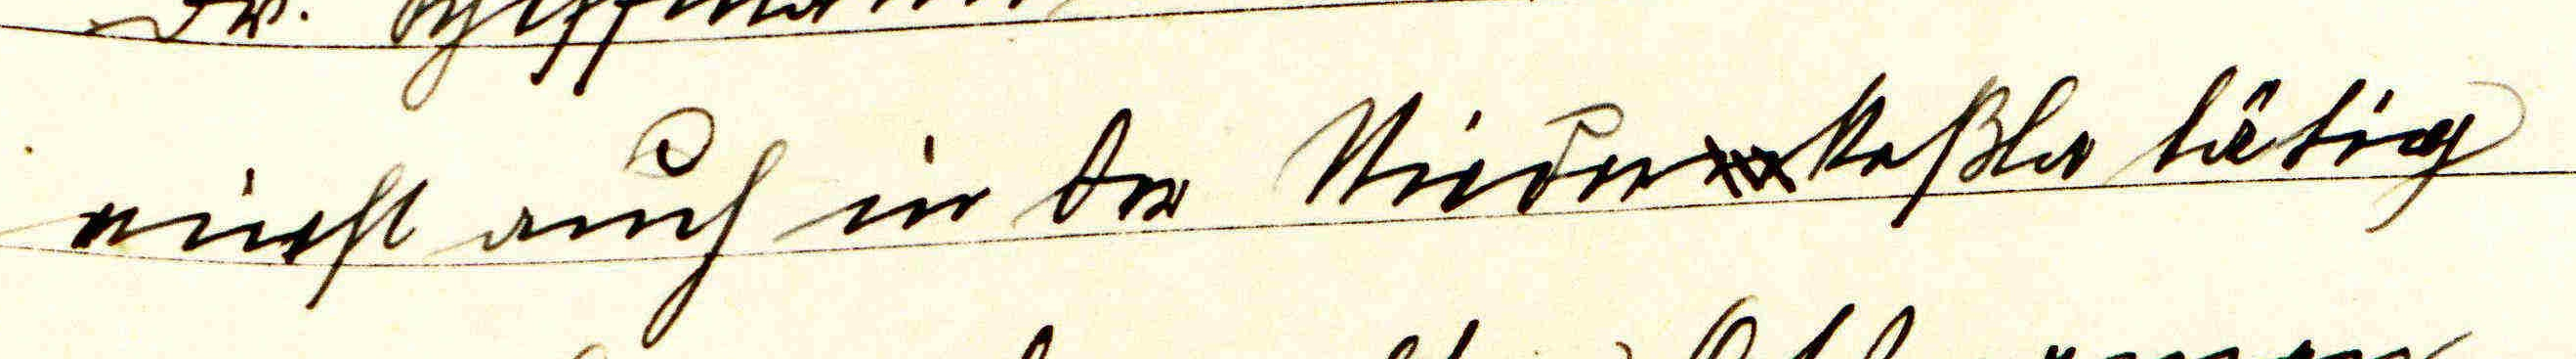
nicht auch in der Niederkeßla tätig
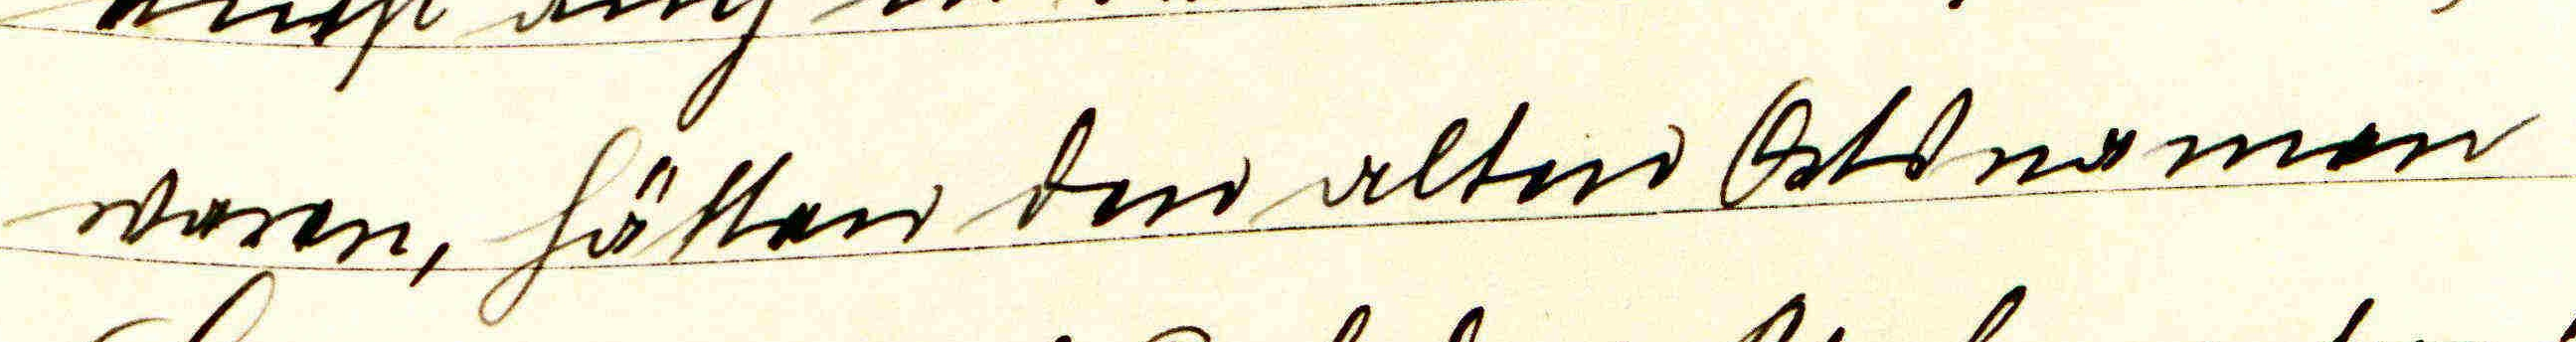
waren, hätten dem alten Ortsnamen
